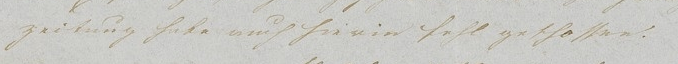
zeitung habe auch hierin fehl geschlossen.
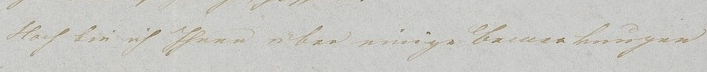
Noch bin ich Ihnen über einige Bemerkungen
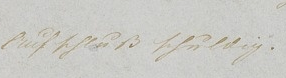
Aufschluß schuldig.
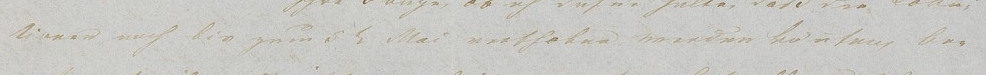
tionen noch bis zum 5ten Mai verschoben werden könnten, be-
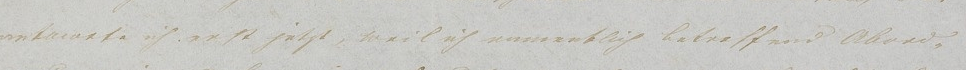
antworte ich erst jetzt, weil ich namentlich betreffend Abord-
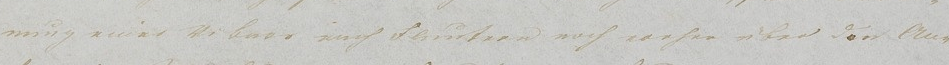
nung eines Vikars nach Fluntern noch vorher über den An-
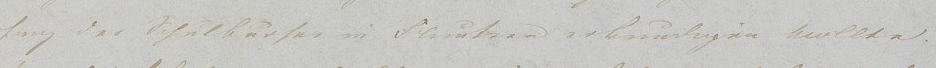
fang des Schulkurses in Fluntern erkundigen wollte.
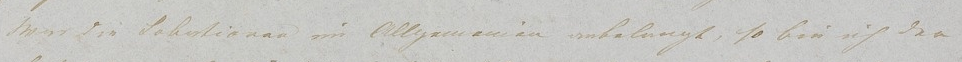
Was die Lokationen im Allgemeinen anbelangt, so bin ich der
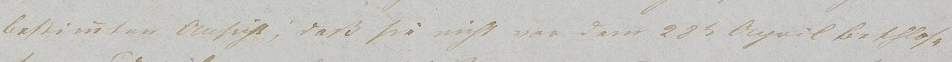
bestimmten Ansicht, daß sie nicht vor dem 28ten April beschlos-
